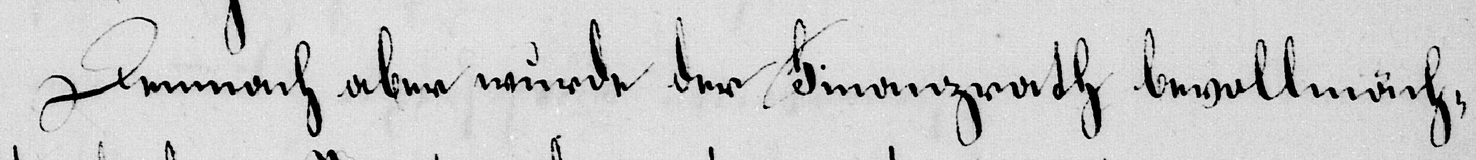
Demnach aber wurde der Finanzrath bevollmäch¬
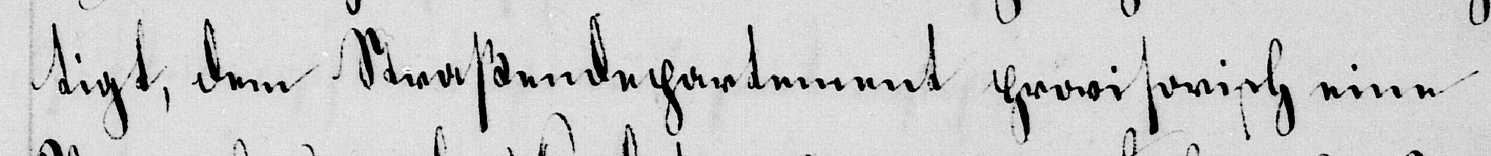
tigt, dem Straßendepartement provisorisch eine
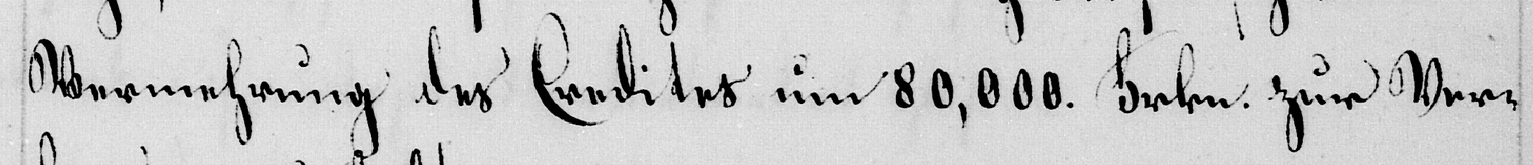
Vermehrung des Credites um 80,000. Frkn. zur Ver¬
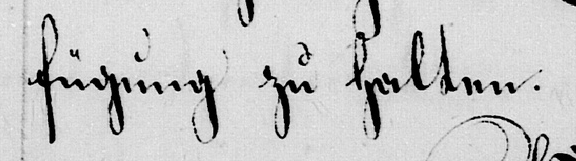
fügung zu halten.
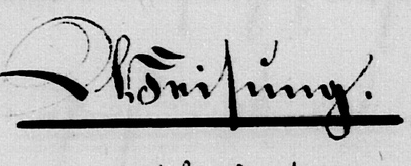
Weisung.
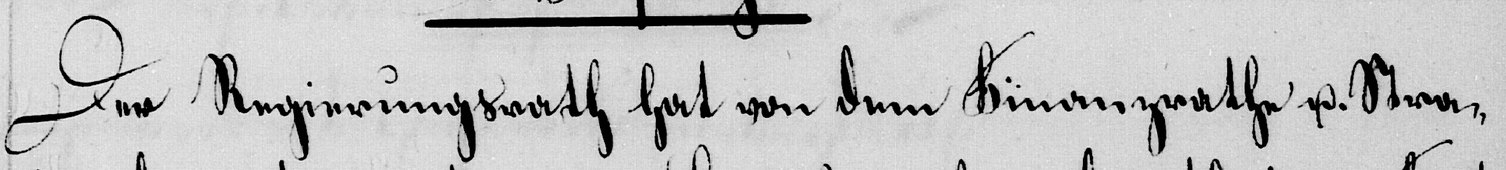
Der Regierungsrath hat von dem Finanzrathe u. Stra¬
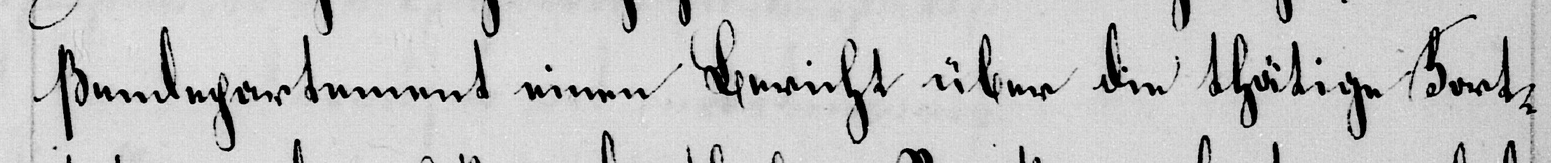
ßendepartement einen Bericht über die thätige Fort¬
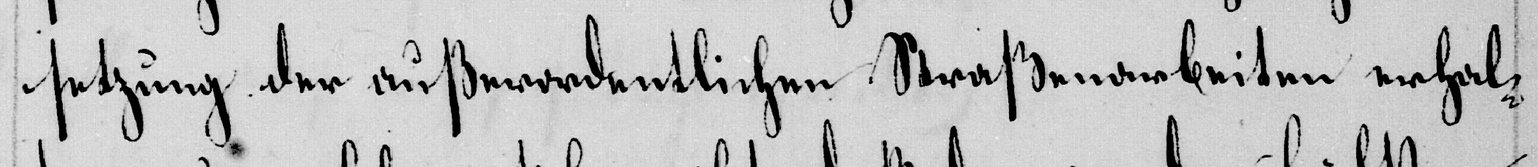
setzung der außerordentlichen Straßenarbeiten erhal¬
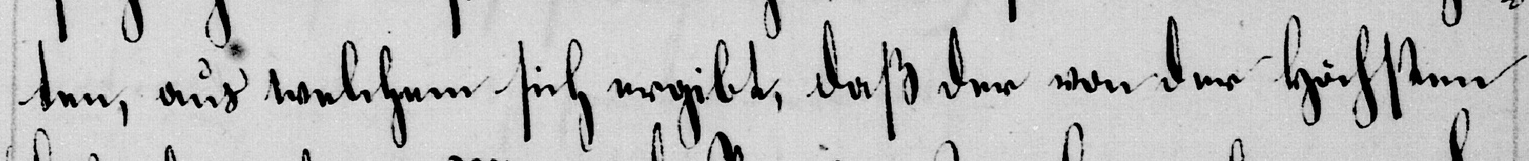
ten, aus welchem sich ergibt, daß der von der höchsten
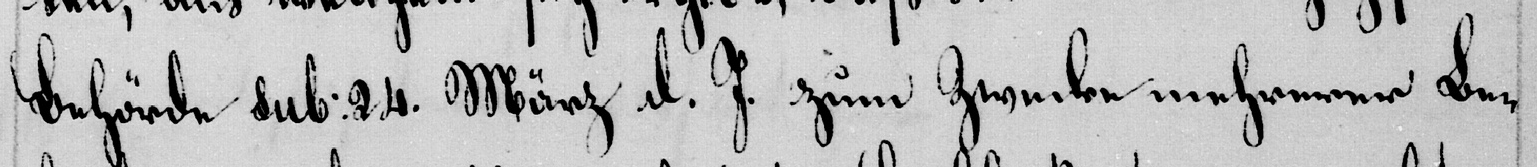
Behörde sub: 24. März d. J. zum Zwecke mehrerer Be¬
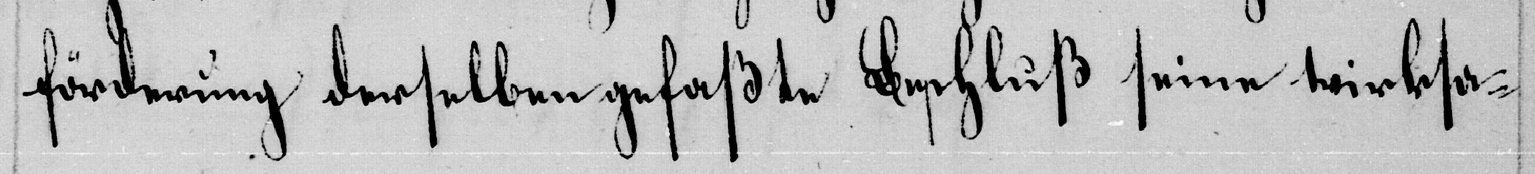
förderung derselben gefaßte Beschluß seine wirksa-
